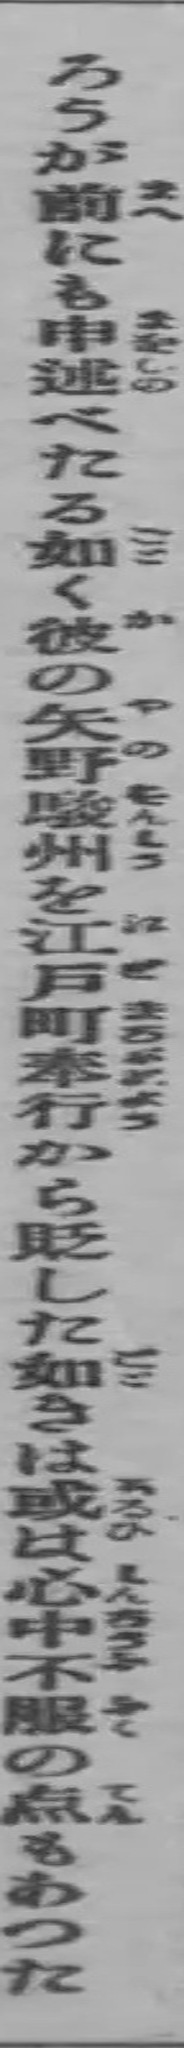ろうが前にも申述べたる如く彼の矢野駿州を江戸町奉行から貶した如きは或は心中不服の点もあつた
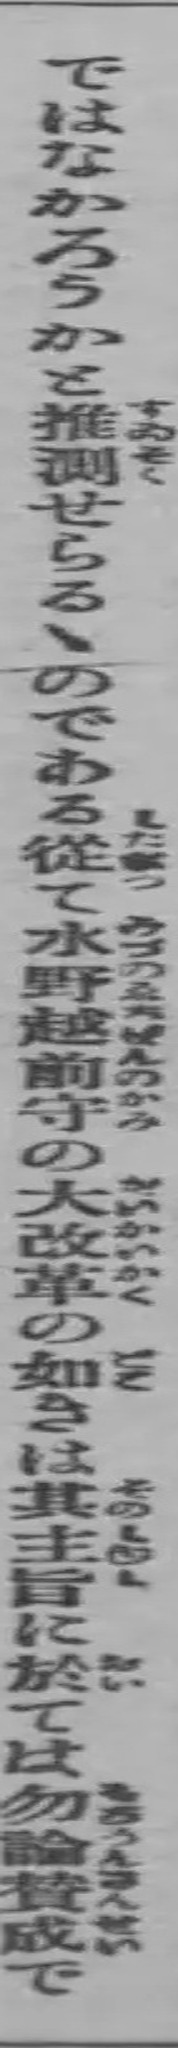ではなかろうかと推測せらるゝのである従て水野越前守の大改革の如きは其主旨に於ては勿論賛成で
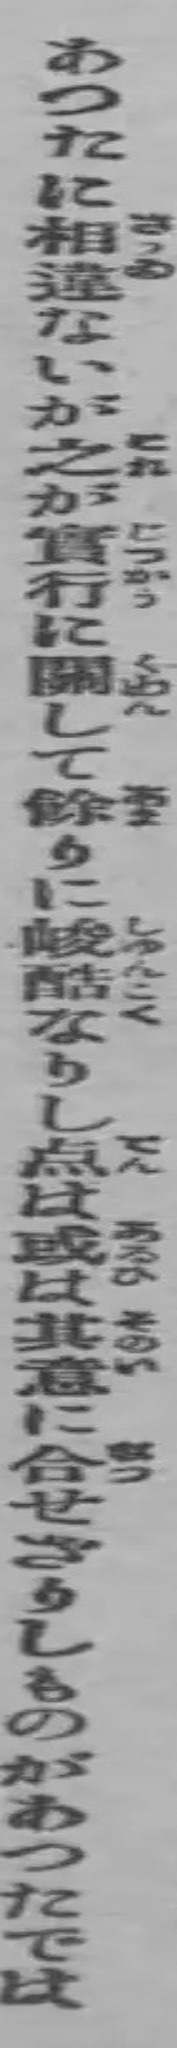あつたに相違ないが之が実行に関して余りに峻酷なりし点は或は其意に合せざりしものがあつたでは
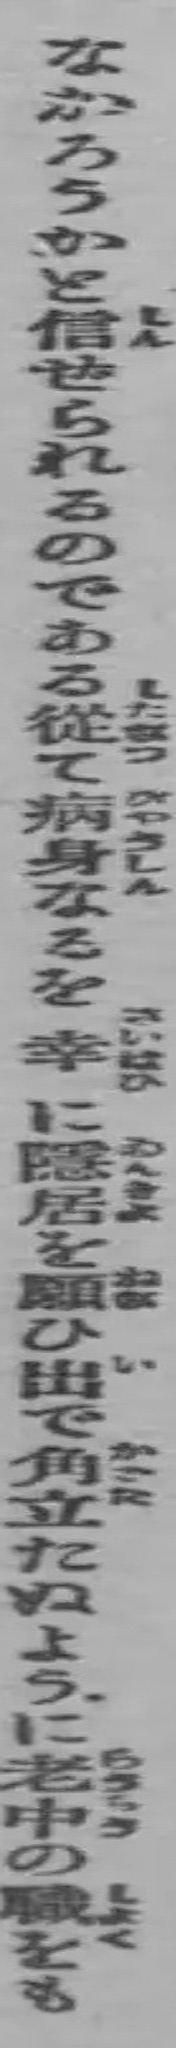なかろうかと信ぜられるのである従て病身なるを幸に隠居を願ひ出で角立たぬように老中の職をも
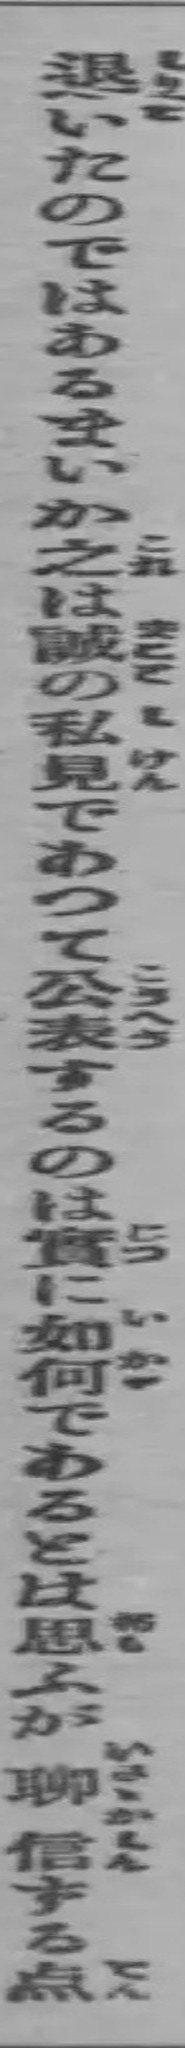退いたのではあるまいか之は誠に私見であつて公表するのは実に如何であるとは思ふが聊信ずる点

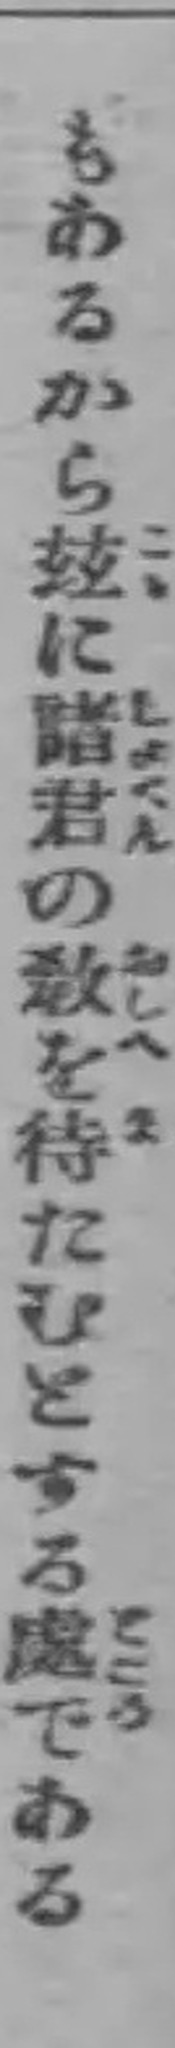もあるから茲に諸君の教を待たむとする処である
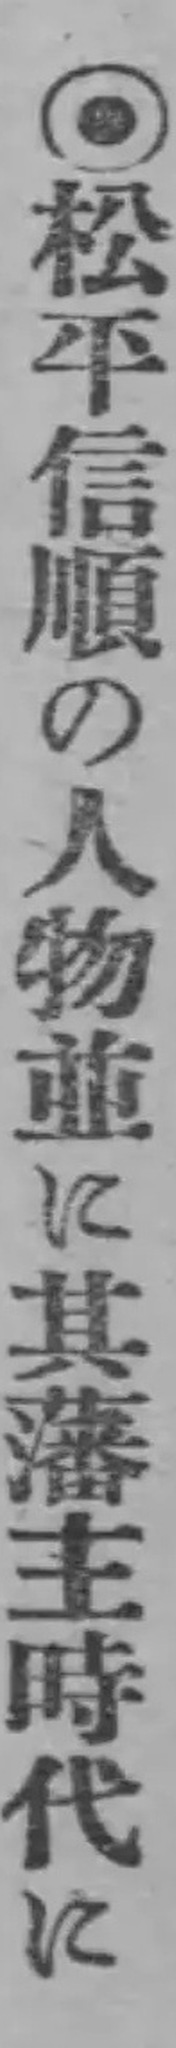⦿松平信順の人物並に其藩主時代に
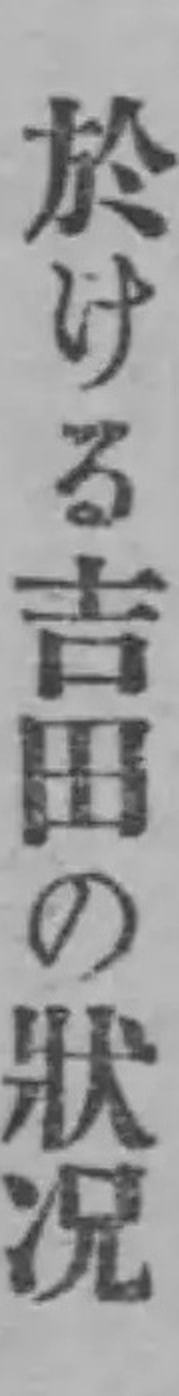於ける吉田の状況
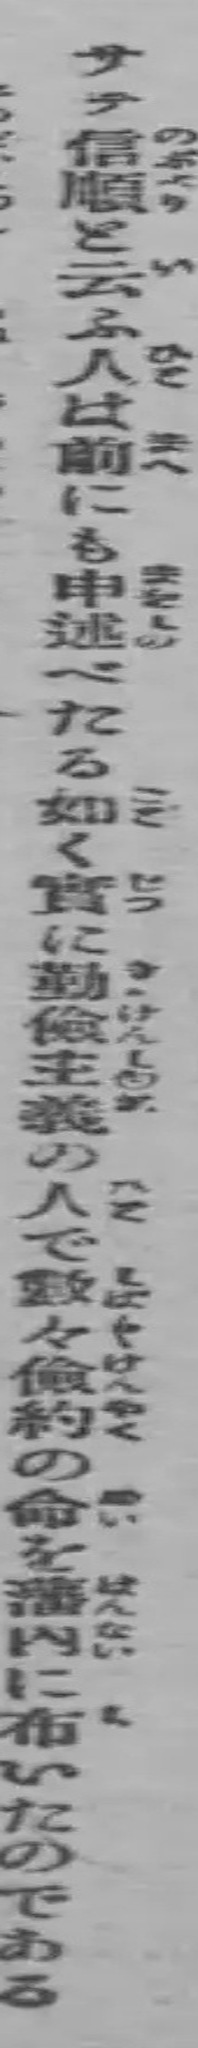信順の性行サテ信順と云ふ人は前にも申述べたる如く実に勤倹主義の人で数々倹約の命を藩内に布いたのである
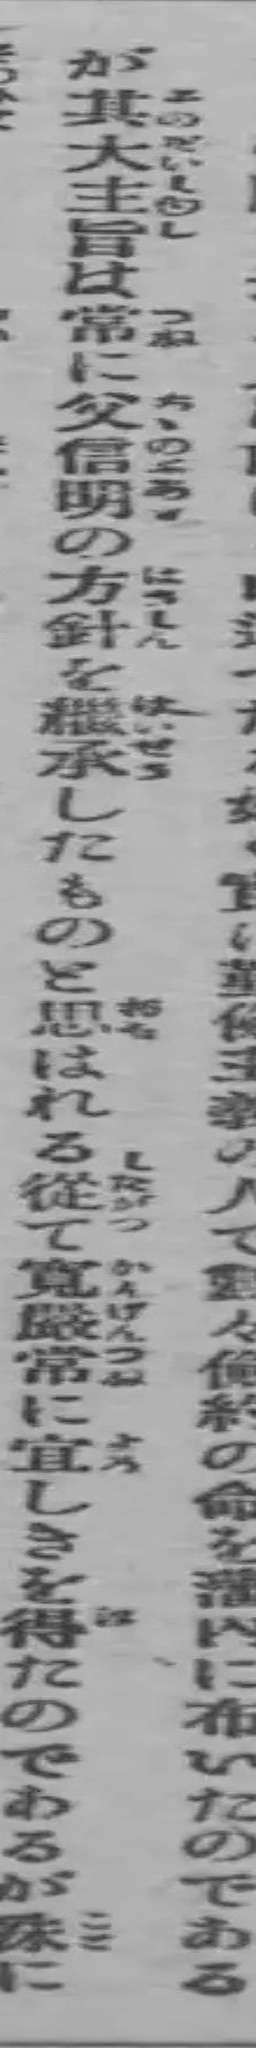が其大主旨は常に父信明の方針を継承したものと思はれる従て寛厳常に宜しきを得たのであるが殊に
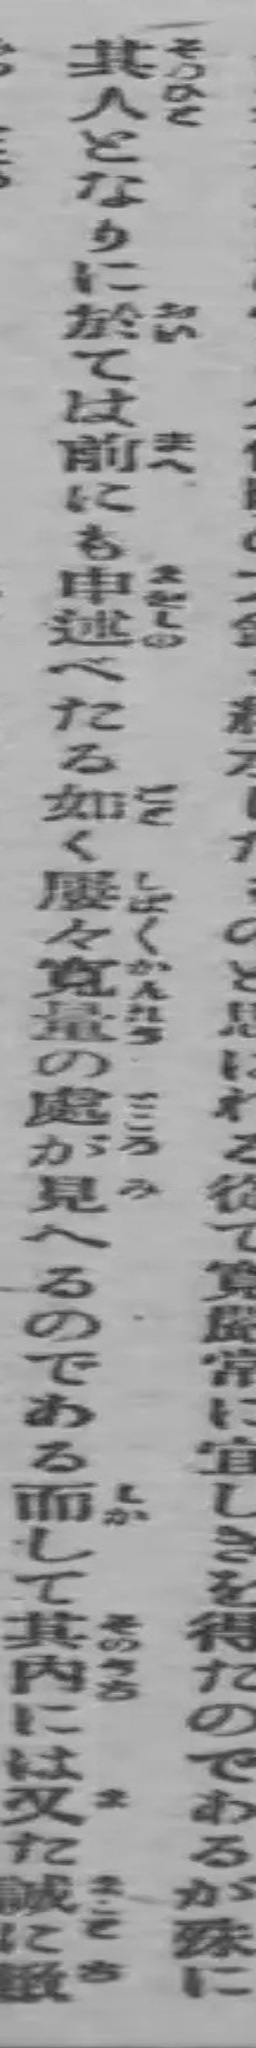其人となりに於ては前にも申述べたる如く屡々寛量の処が見へるのである而して其内には又た誠に緻
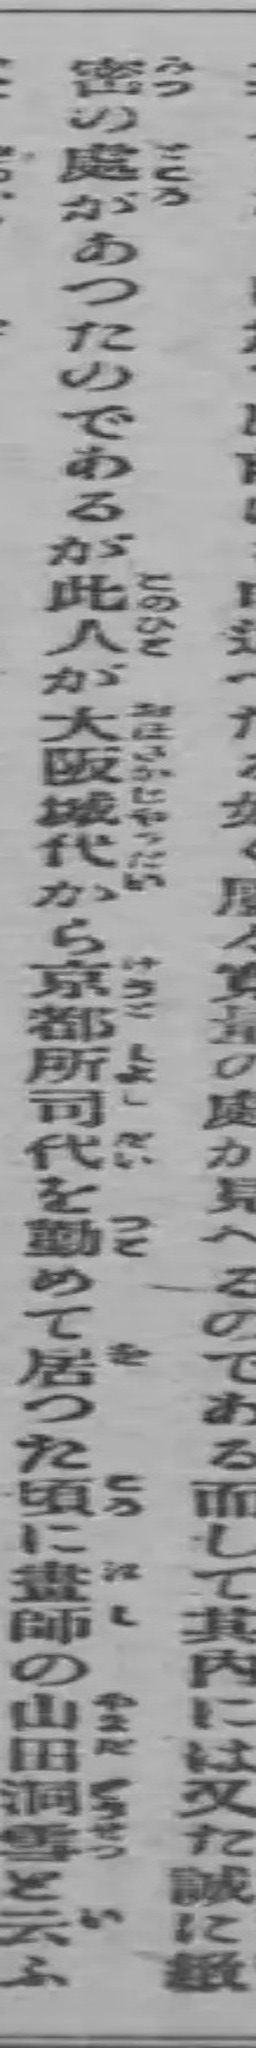山田洞雪密の処があつたのであるが此人が大阪城代から京都所司代を勤めて居つた頃に画師の山田洞雪と云ふ
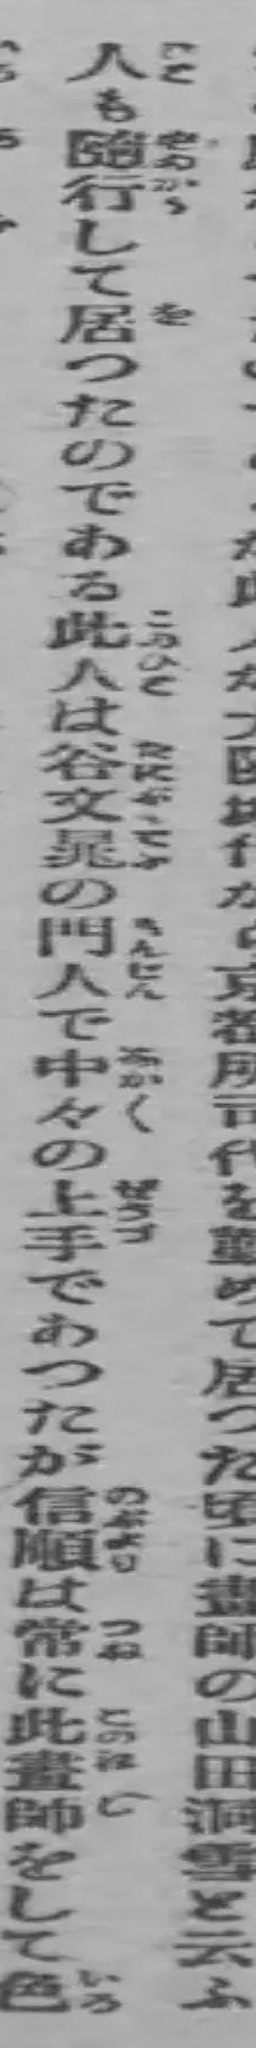人も随行して居つたのである此人は谷文晁の門人で中々の上手であつたが信順は常に此画師をして色
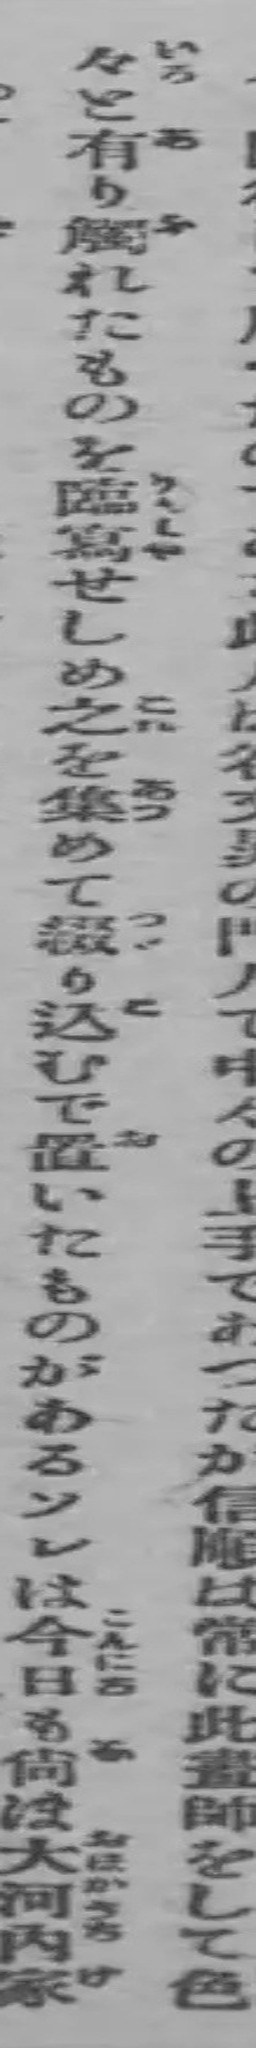色と有り觸れたものを臨写せしめ之を集めて綴り込むで置いたものがあるソレは今日も尚ほ大河内家
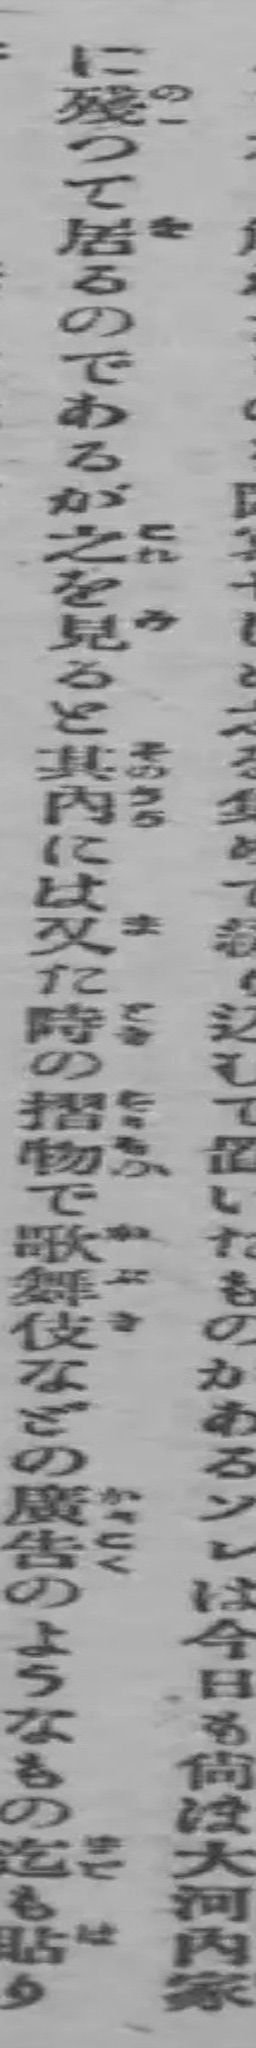に残つて居るのであるが之を見ると其内には又た時の摺物で歌舞伎などの広告のようなもの迄も貼り
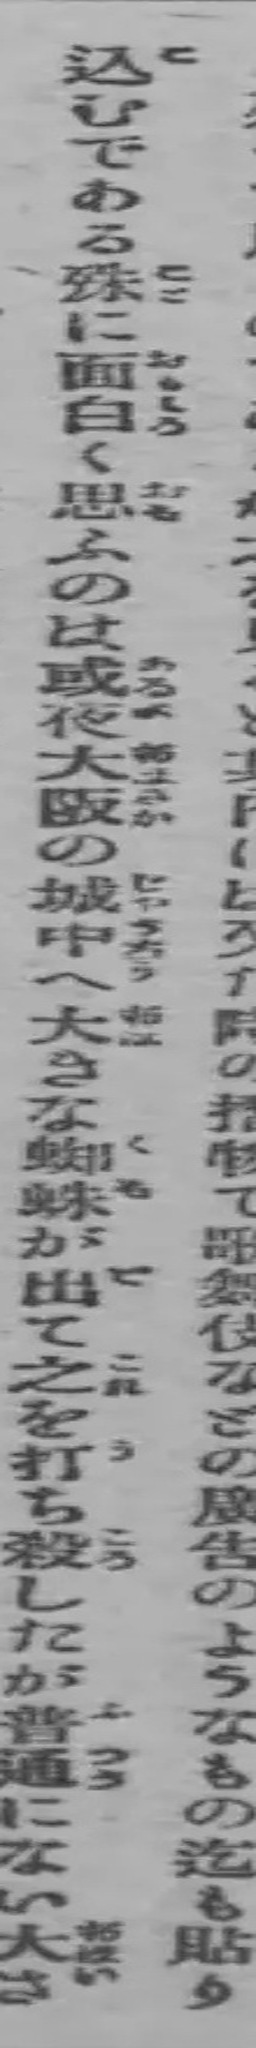込むである殊に面白く思ふのは或夜大阪の城中へ大きな蜘蛛が出て之を打ち殺したが普通にない大さ
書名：豊橋市史談
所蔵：国立国会図書館 National Diet Library, JAPAN
